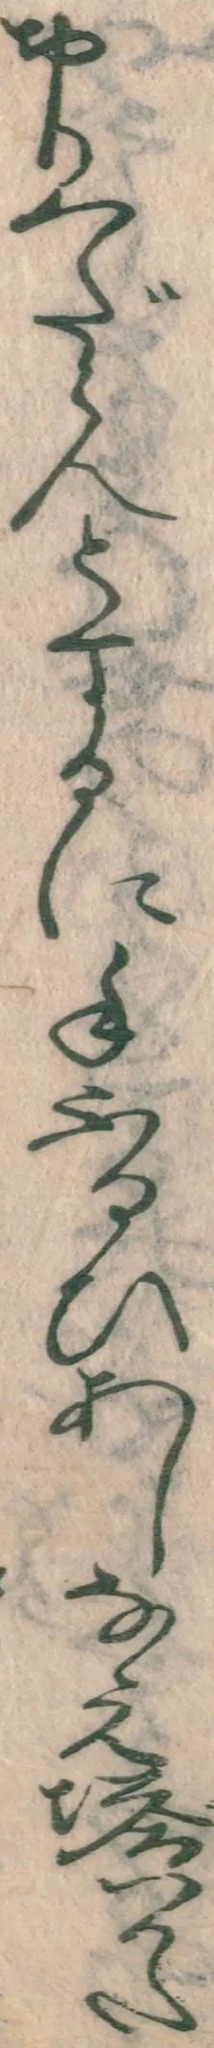おりくだらんとするに手ふるひあしなえ塔はかた
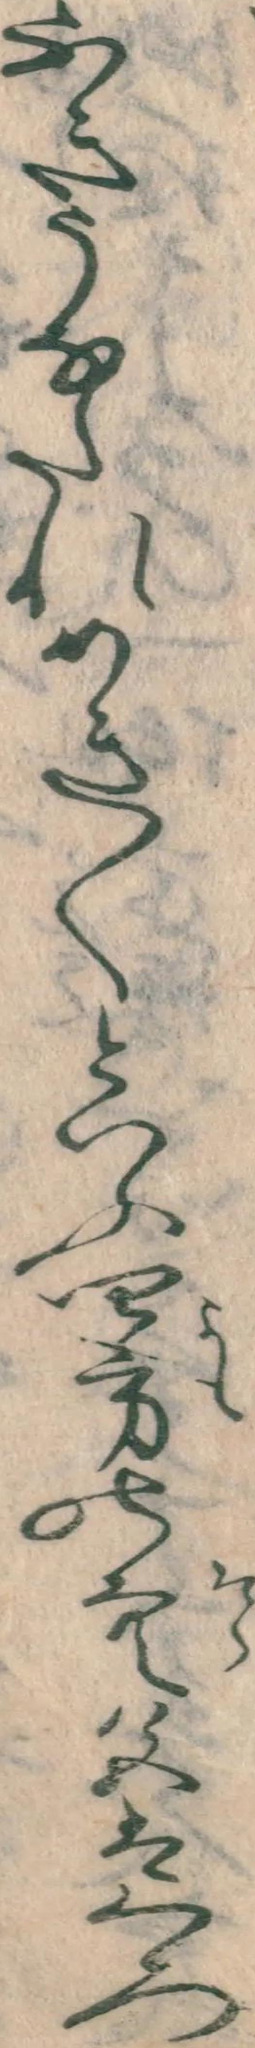ふきうなたれめき〳〵といふ四方の空色はくろ
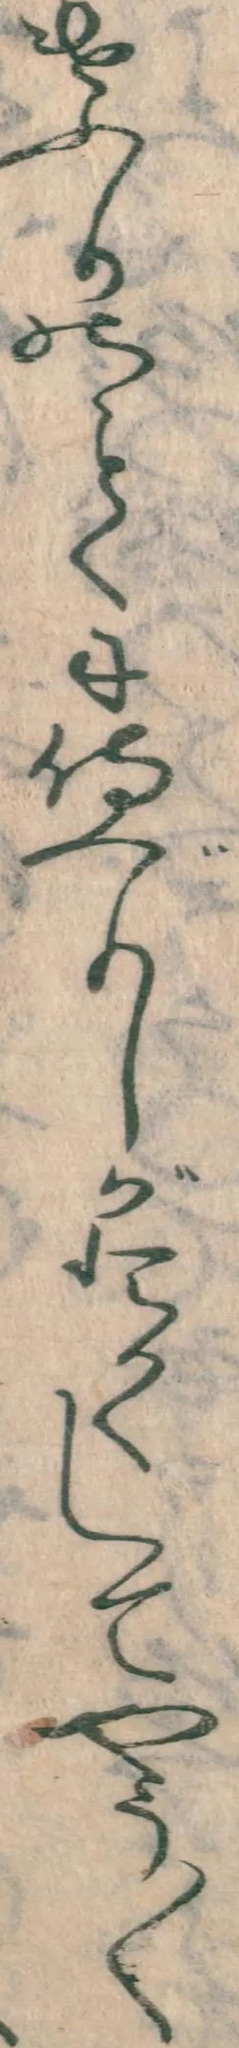けふりのことくに侍べりしがとかくしてやう〳〵
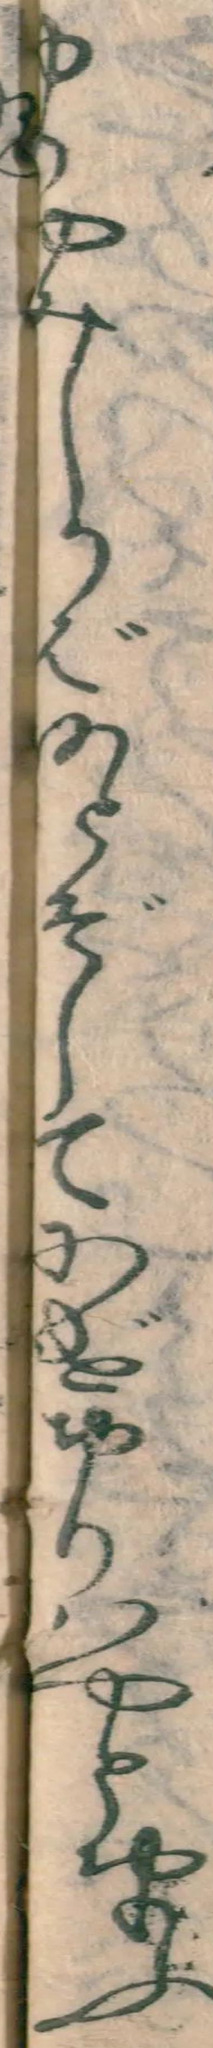ゆりやみしかば何とぞしてにげおりばやとおもふ
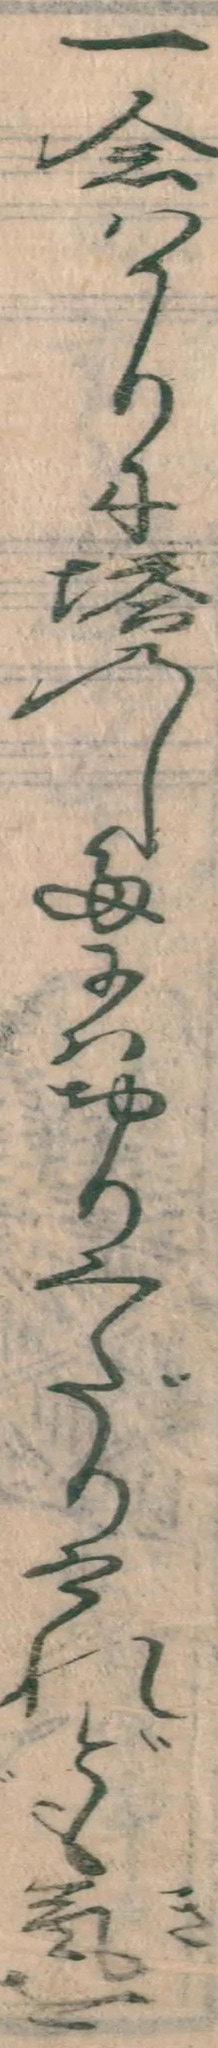一念ばかりに塔のしたにはおりくだりけれども気を
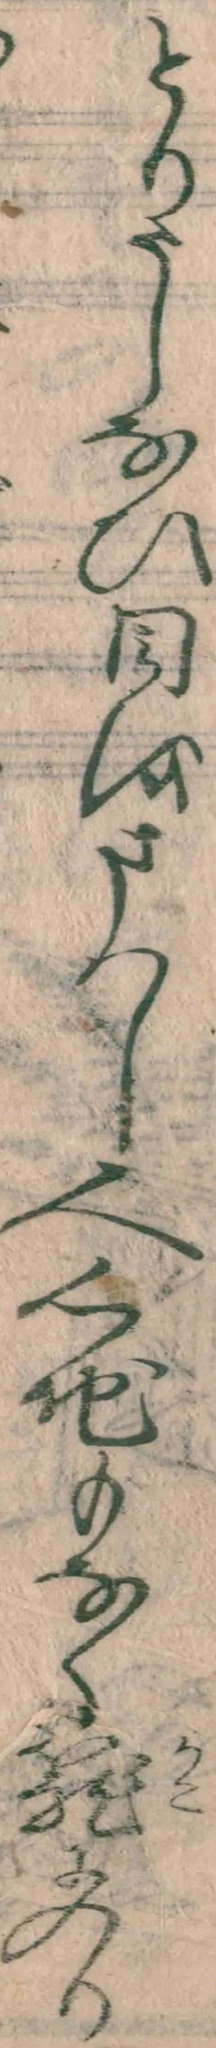とりうしなひ目をまはし人心地もなく籠にのり
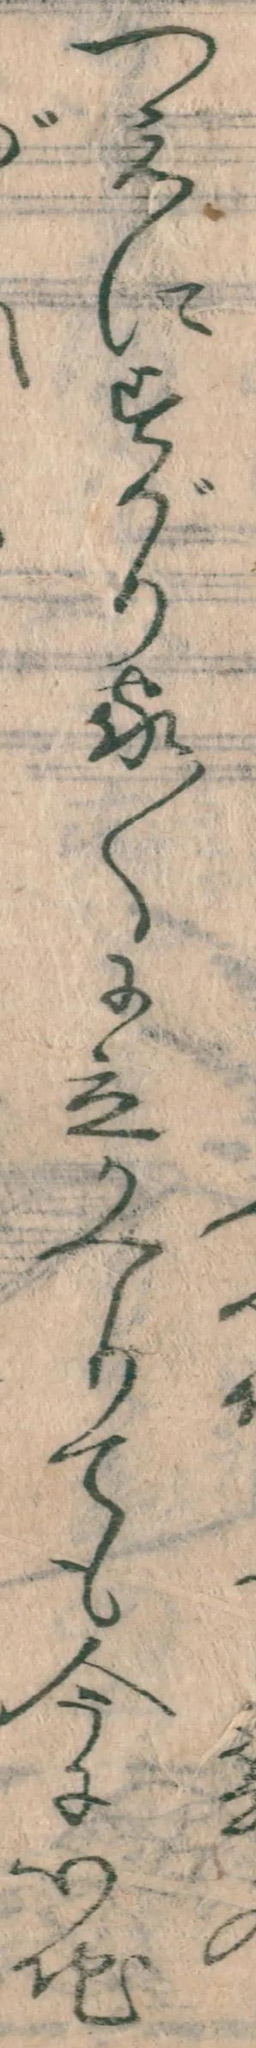つえにすがり家〳〵に立かへりても今に心地
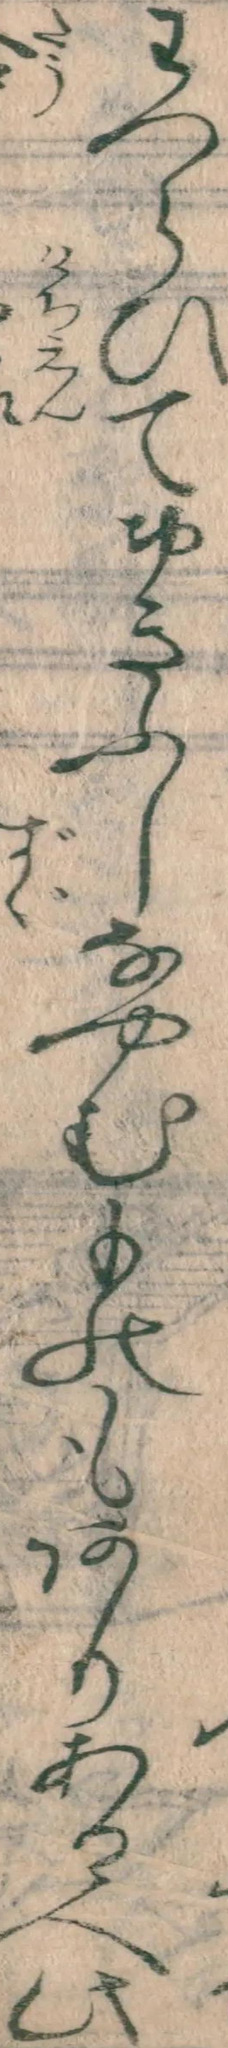わづらひておきふしなやむものもありある人此
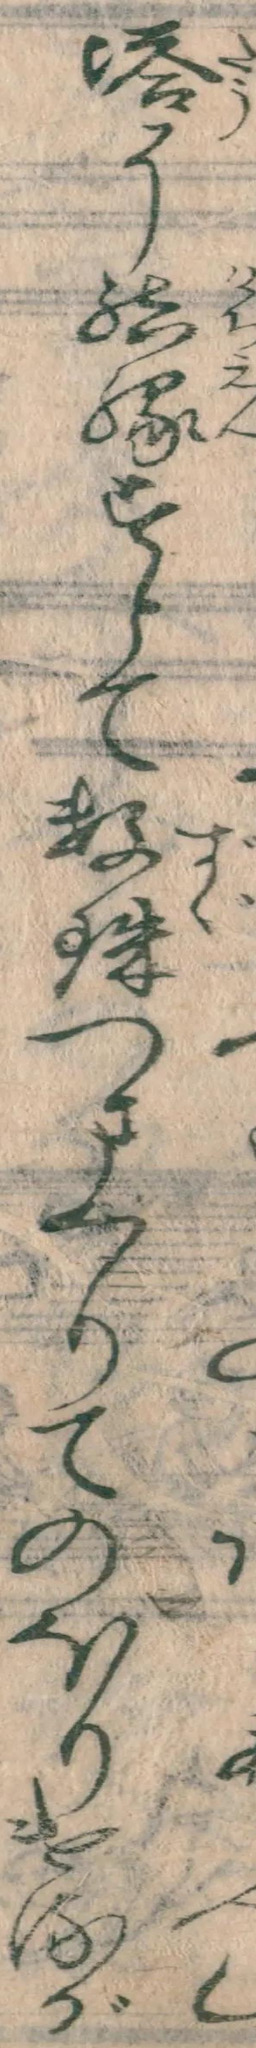塔に結縁すとて数珠つまくりてのほりけるが
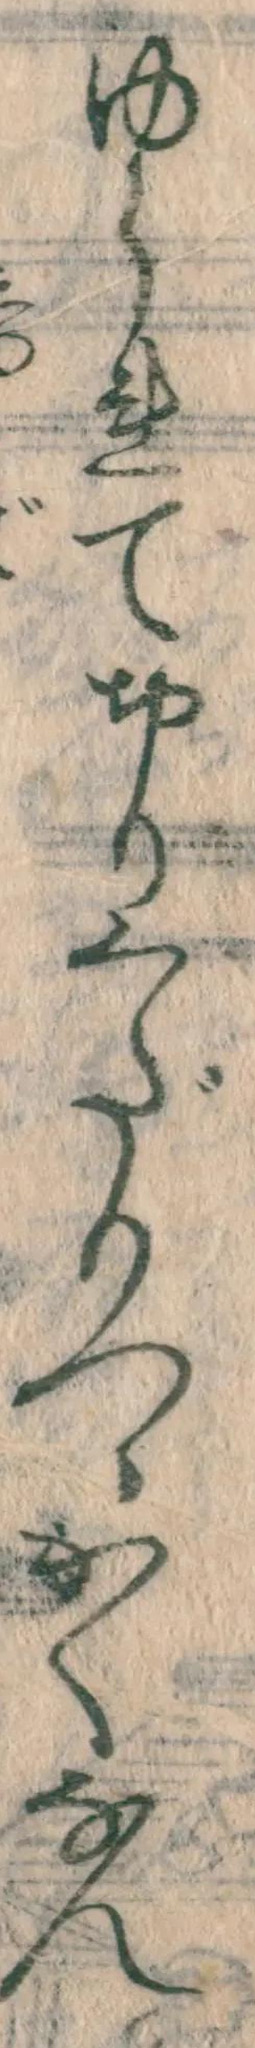ゆられておりくだりつゝかくなん
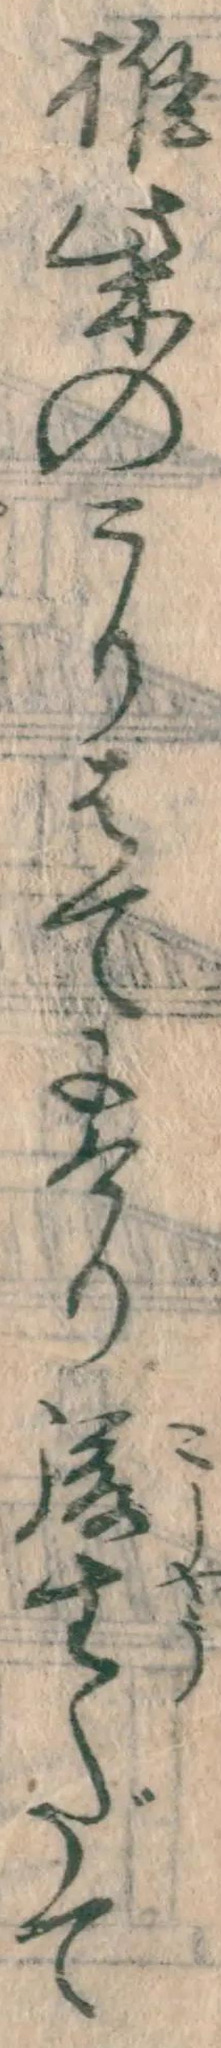椎柴のこりはてにけり後生だて
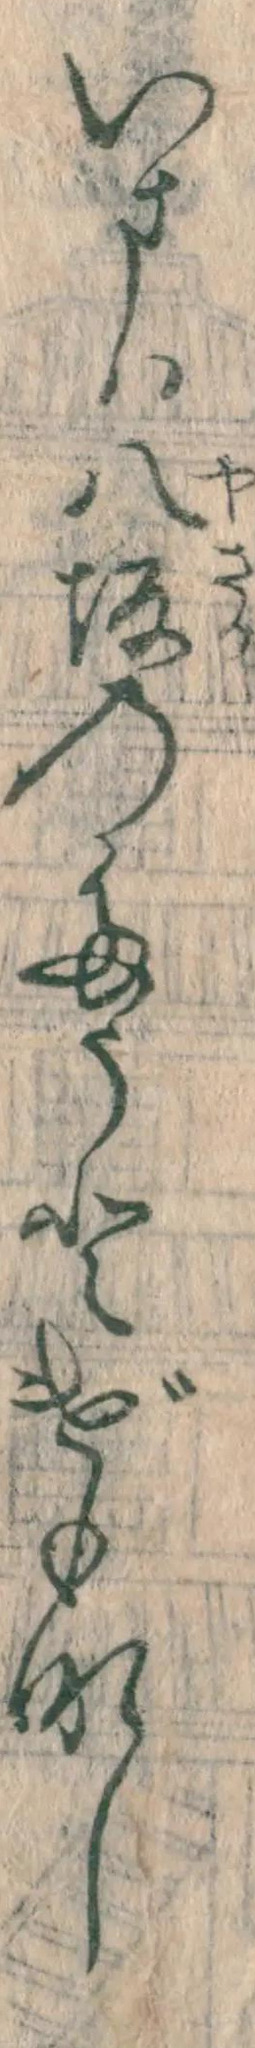いまは八坂のたうとげもなし

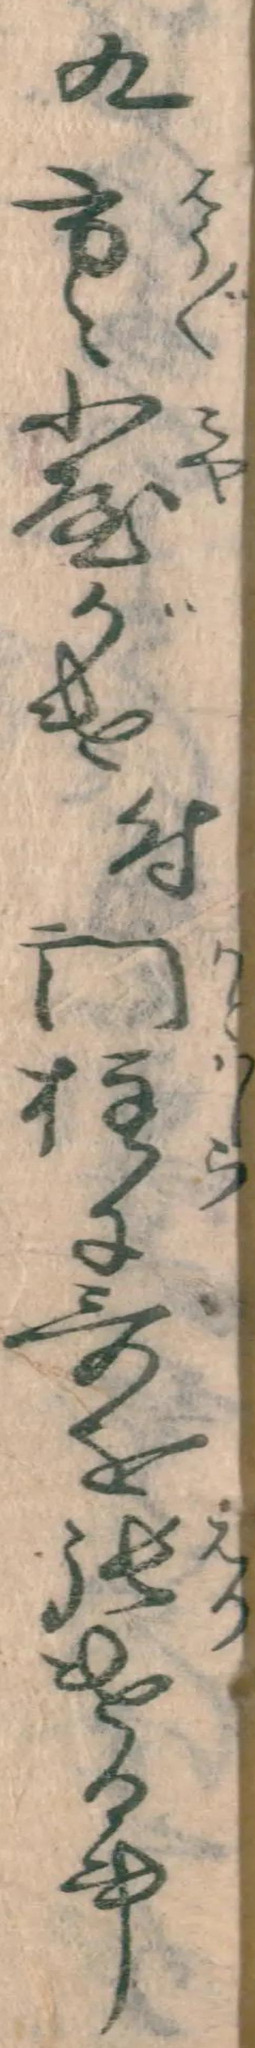九方々小屋がけ付門柱に哥を張ける事
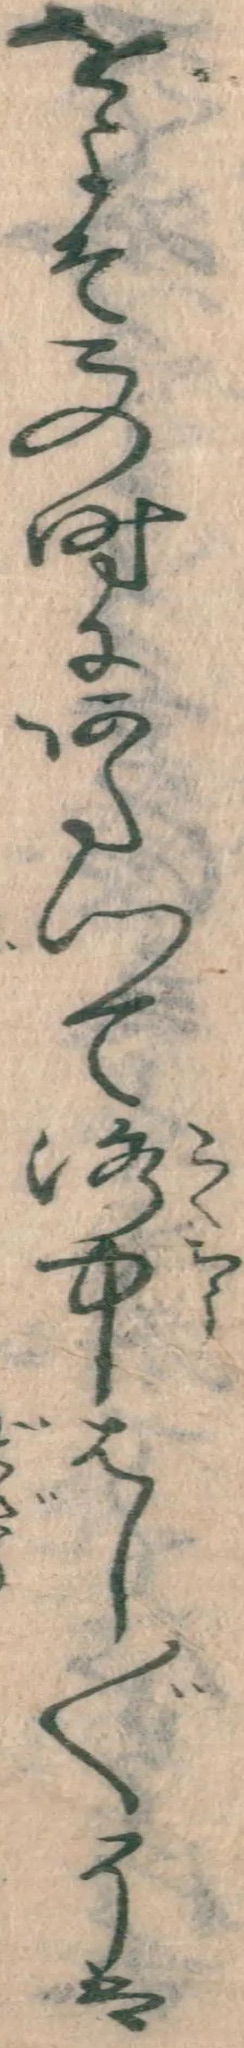をよそこの時にあたつて洛中はし〴〵には
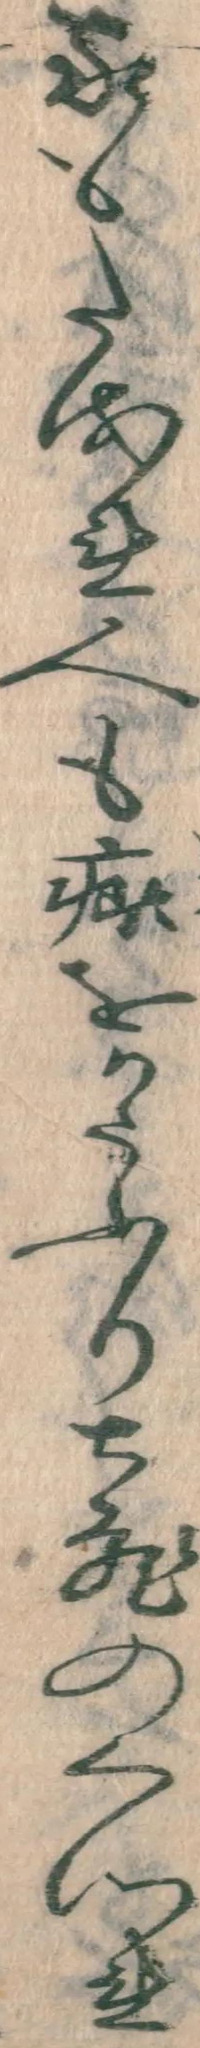家もたをれ人も疵をかうふり土蔵のくづれ
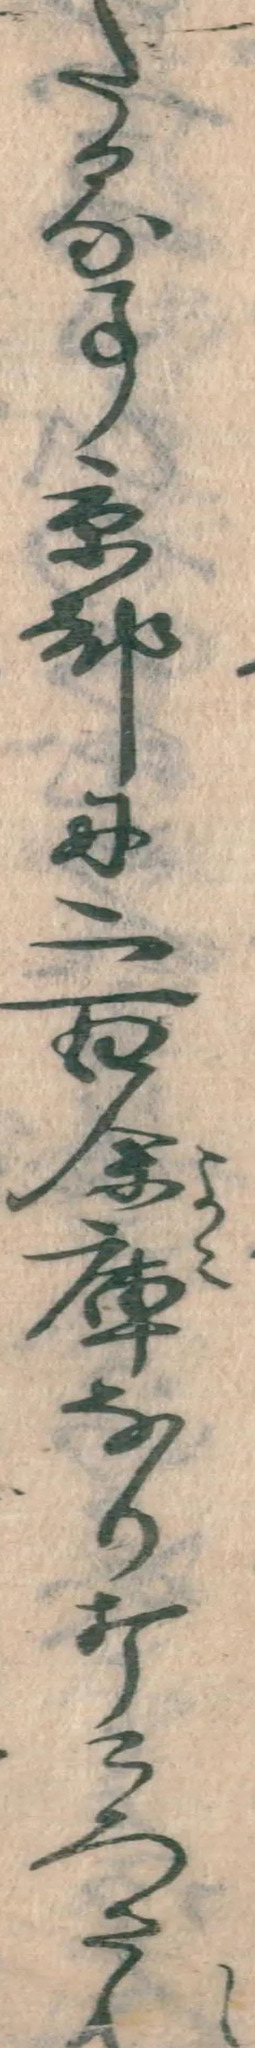たる事京都に二百余庫なり打ころされ
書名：艱難目異志. 上,下
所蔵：国立国会図書館 National Diet Library, JAPAN
